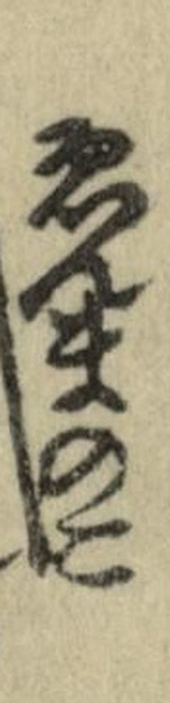ゑんまの子
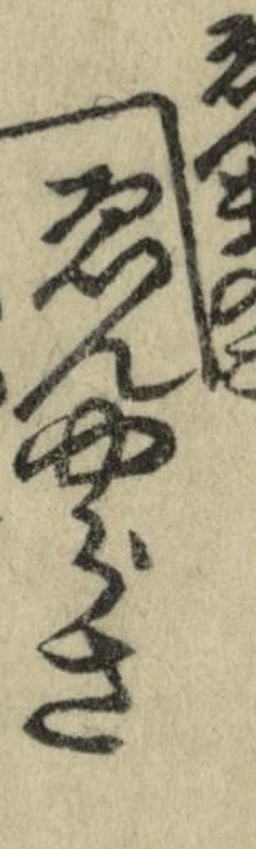〽ゑんやらさ
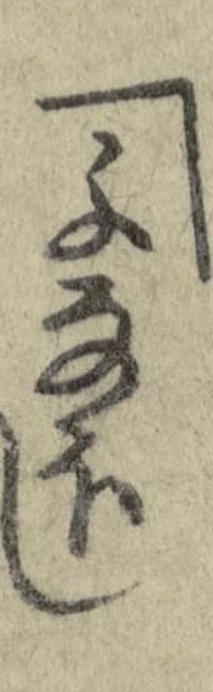〽よなほし
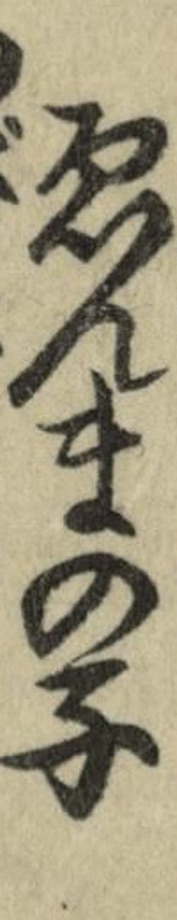ゑんまの子
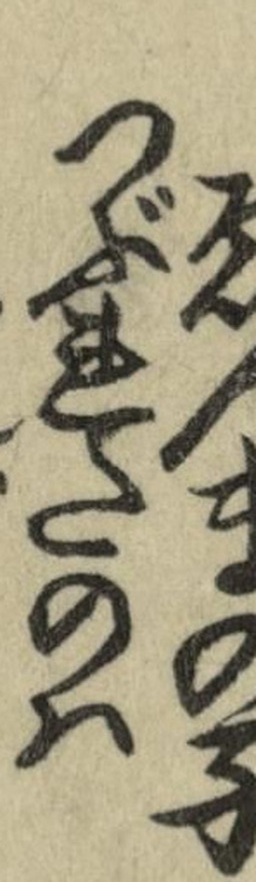つぶれたのは
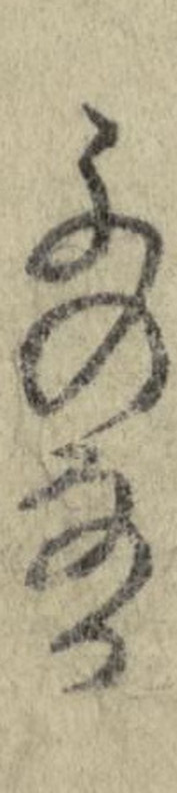よのなか
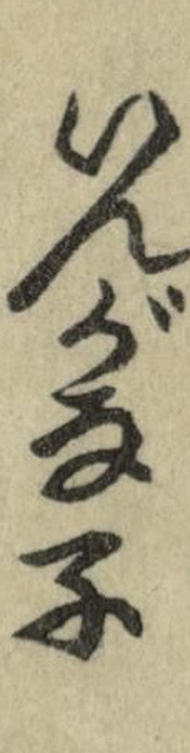いんがな子
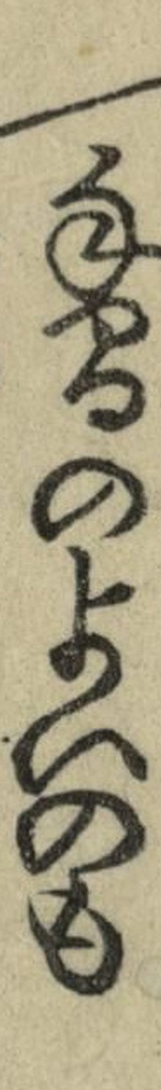〽手間のよいのも
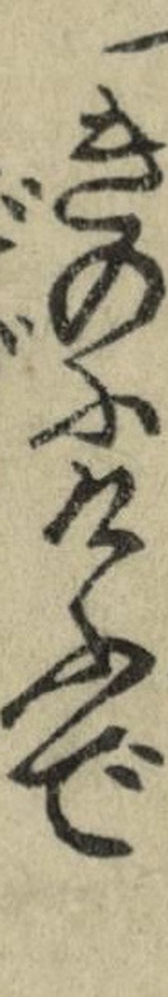きのうけふで
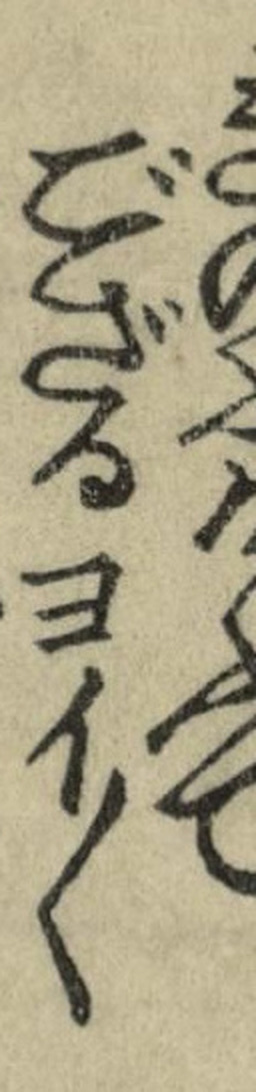ござるヨイ〳〵
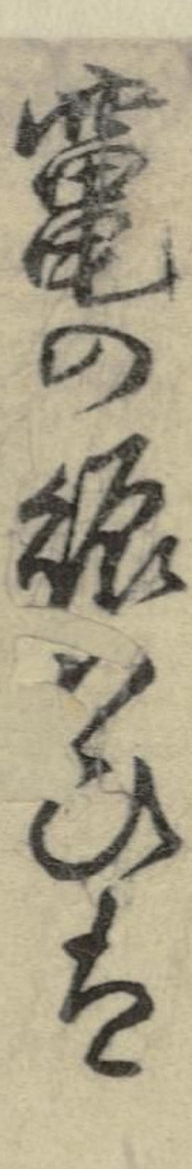竈の賑はひは
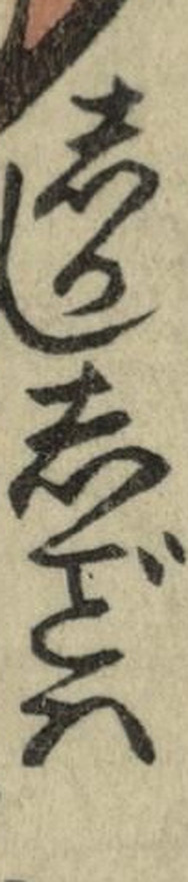しかししごとは
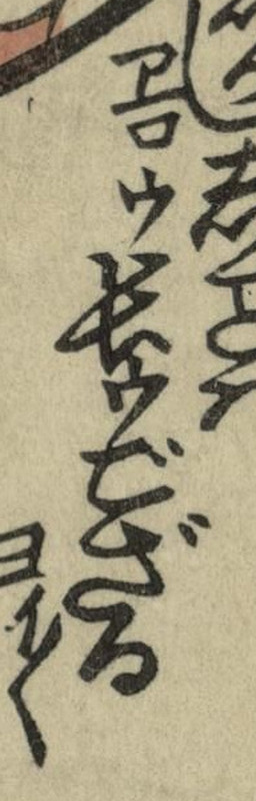ヱロウ長ウござる
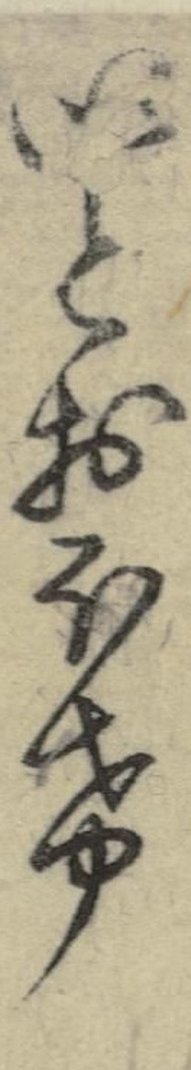いとおほけ
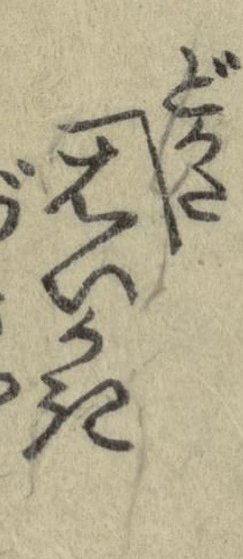〽はいかき
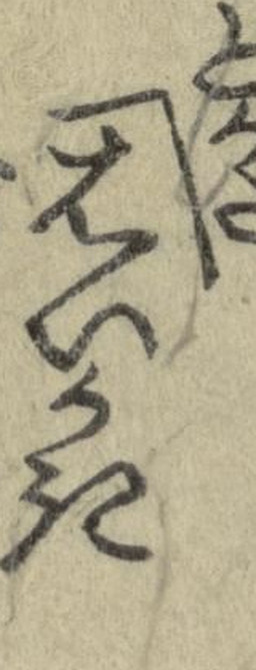〽はいかき
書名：鹿島恐
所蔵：東京大学地震研究所図書室 Earthquake Research Institute Library, The University of Tokyo, JAPAN
